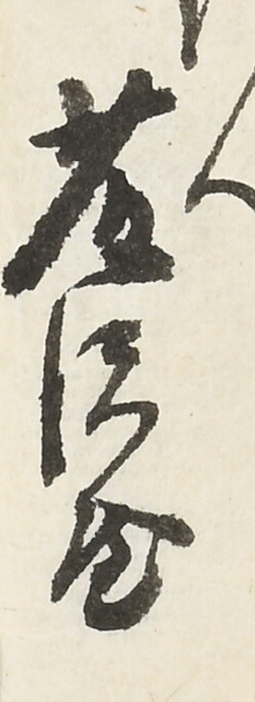藤沢屋
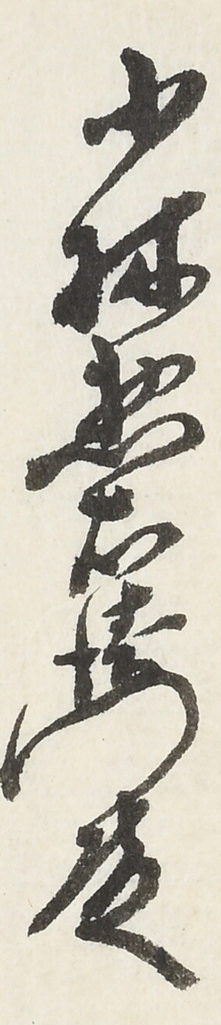小林惣右衛門殿

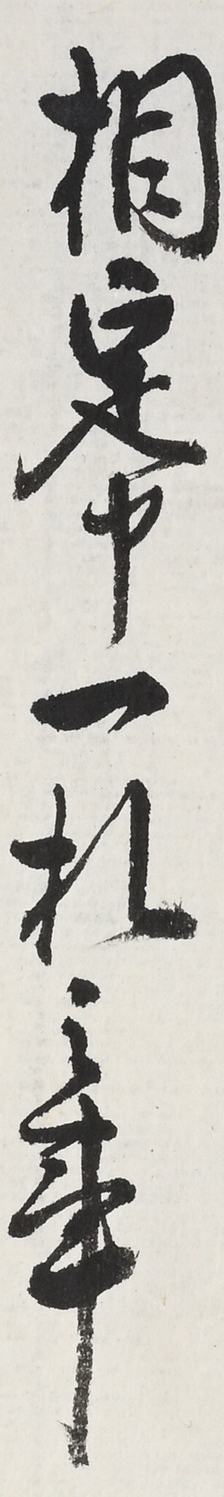相定申一札之事
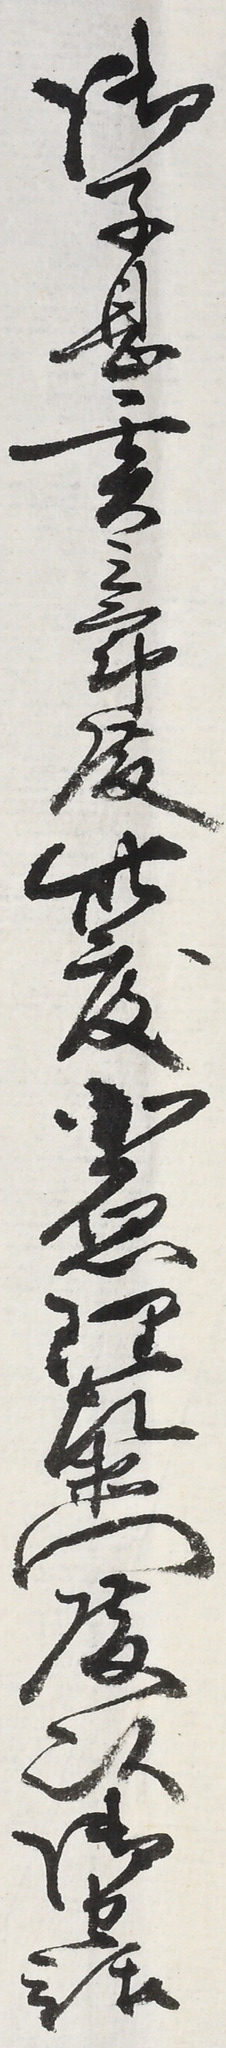御子息亥三郎殿此度北原理左衛門殿以御セ話
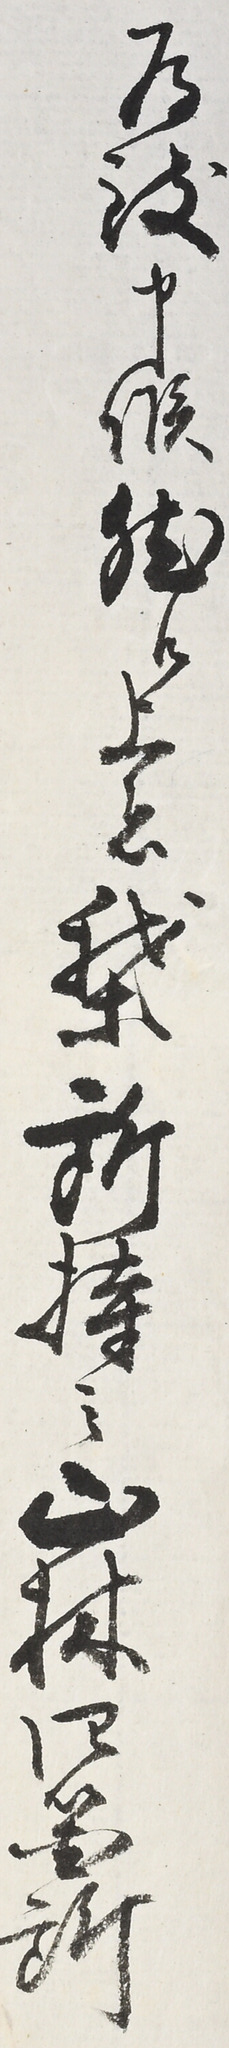為致申候然ル上者我等所持之山林四箇所
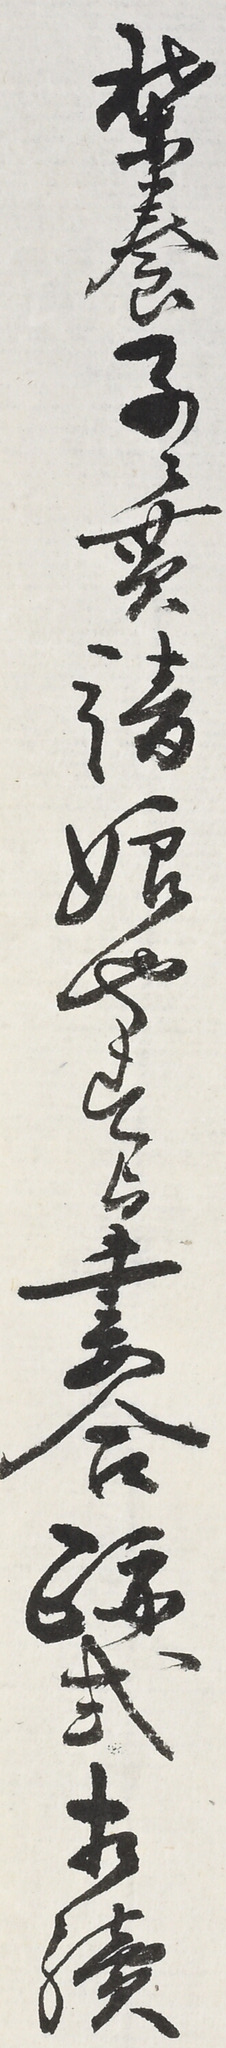我等養子ニ貰請娘やす与妻合跡式相続
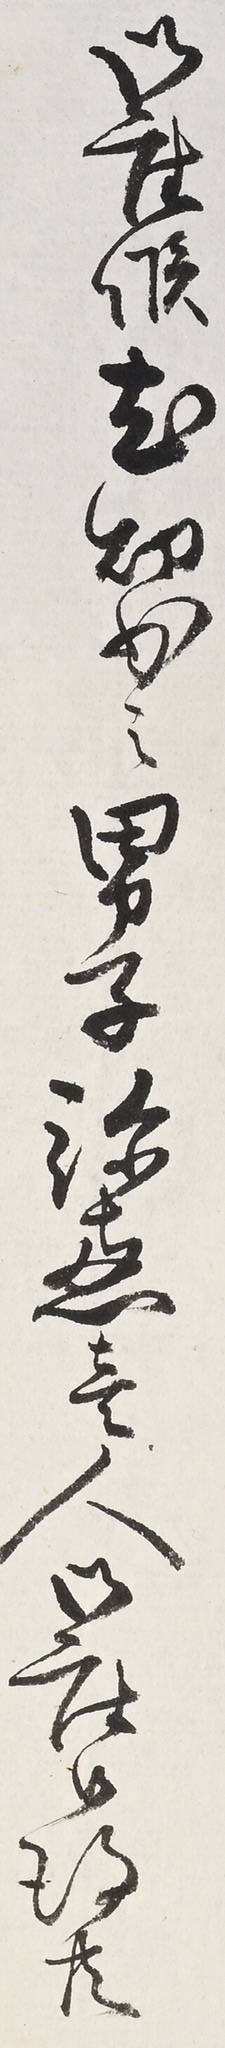御座候尤幼少之男子弥恵壱人御座候得共
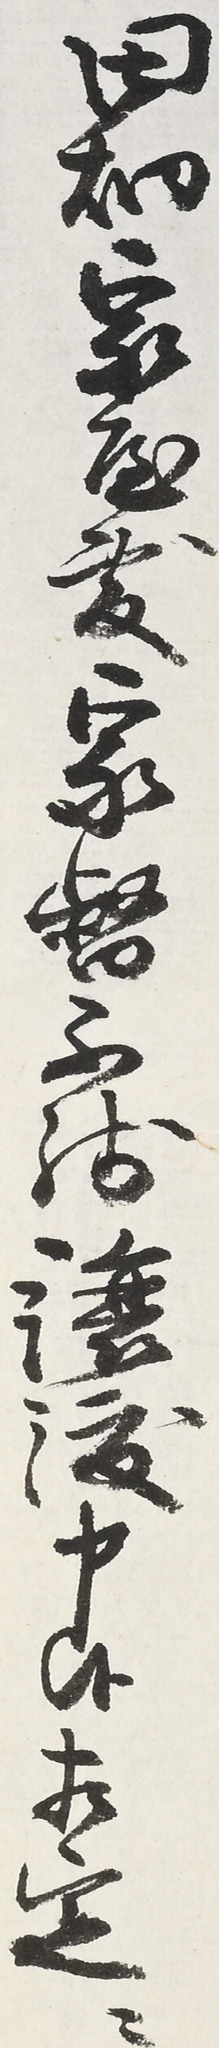田畑家屋敷家督不残譲渡申候相定ニ
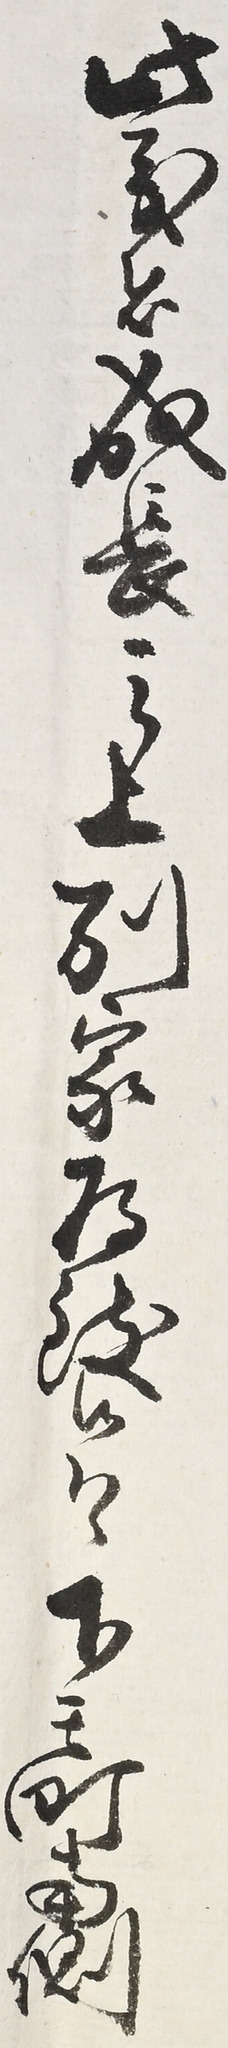此義者成長之上別家為致候ハゝ下モ町南側
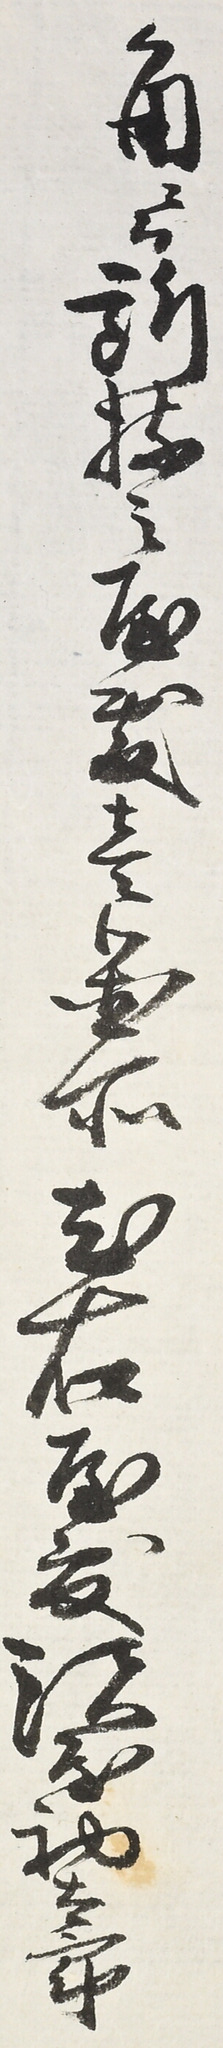角ニ而所持之屋敷壱箇所尤右屋敷沢屋初太郎
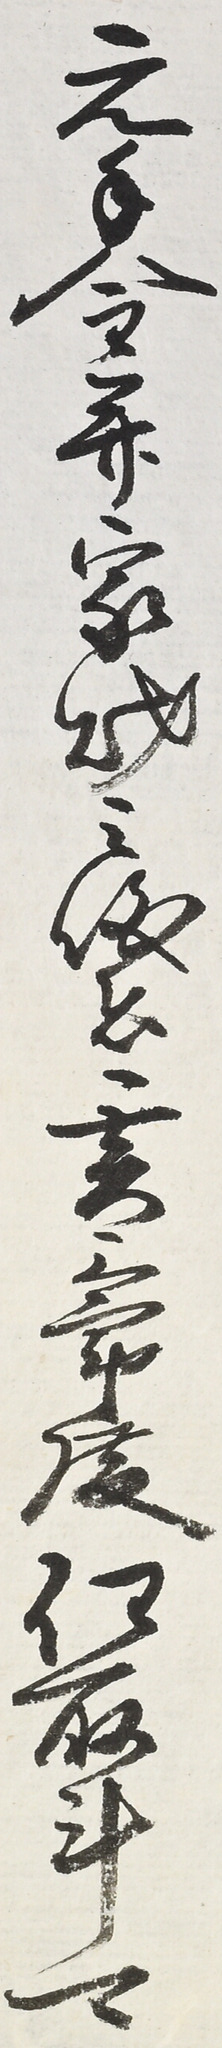元手金幷家財之儀者亥三郎殿任取斗可
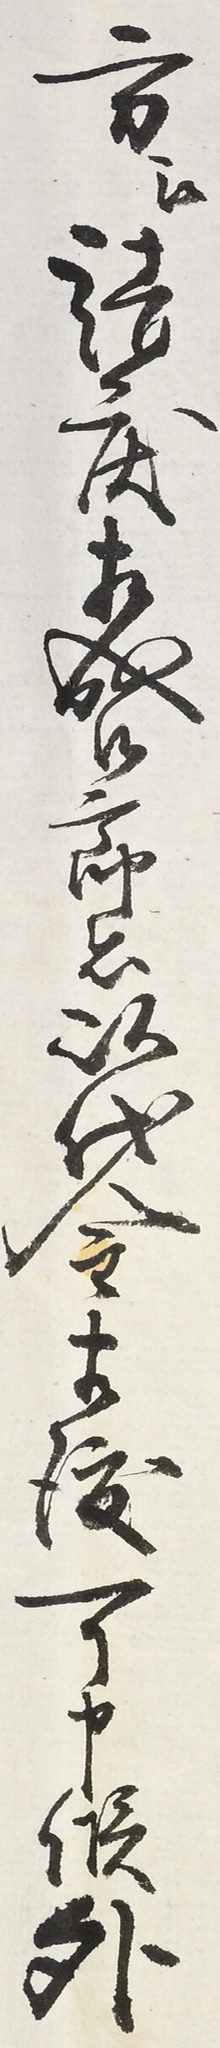方江請戻相成候節者以代金相渡可申候外
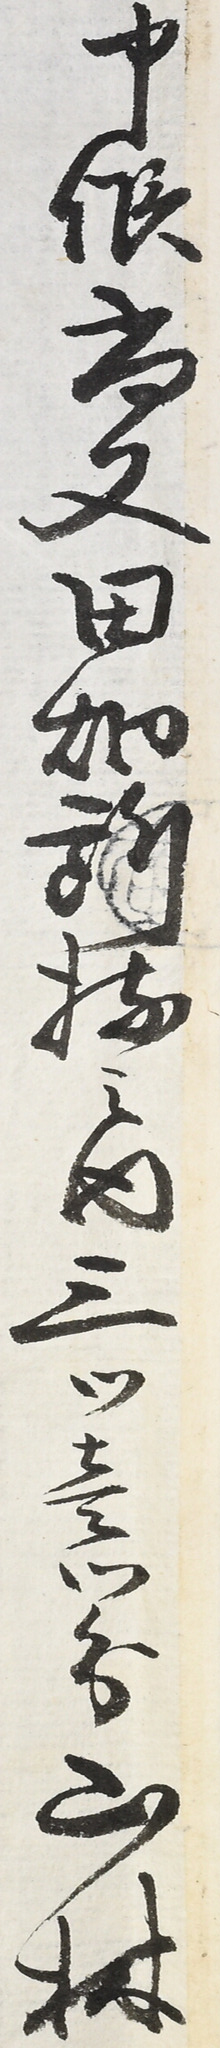申候尚又田畑所持之内三ツ壱ツ分山林
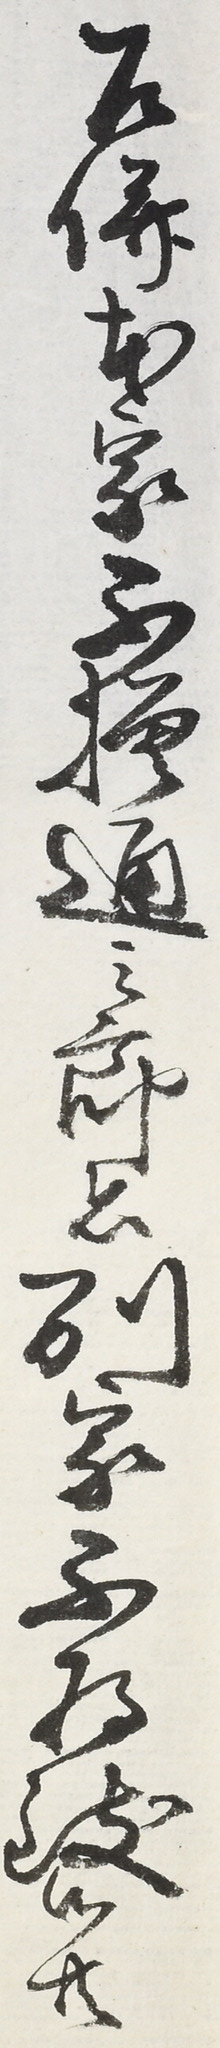乍併本家不模通之節者別家不為致候共
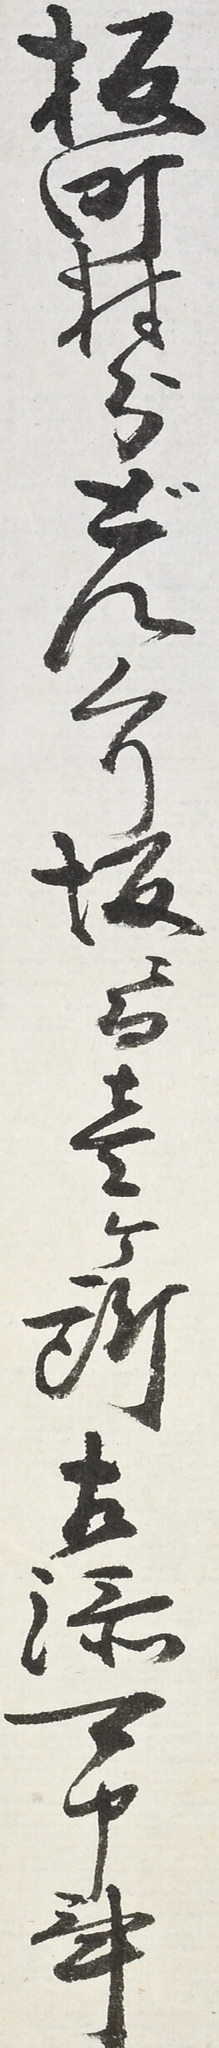板町村分どんくり坂ニ而壱ケ所相添可申事
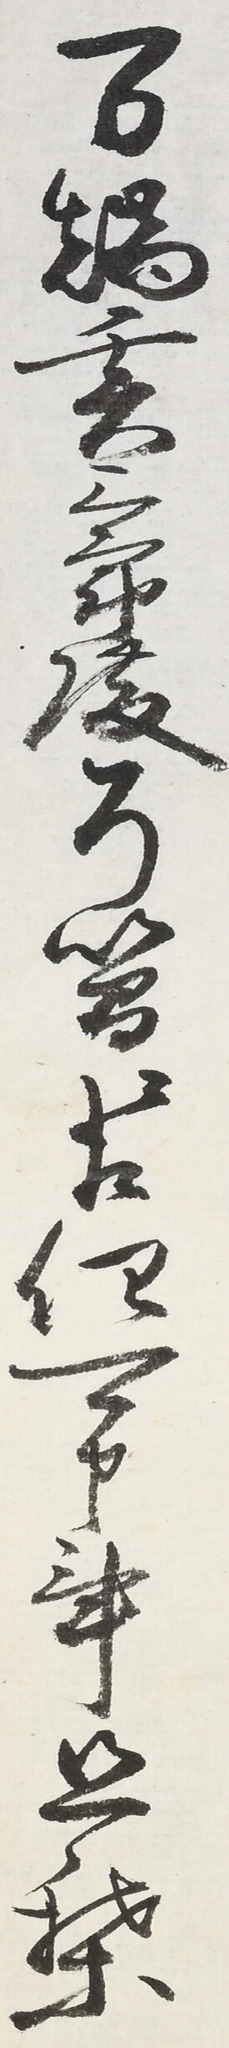万端亥三郎殿了簡ニ相任可申事且我等
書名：相定申一札之事
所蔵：伊那市立高遠町図書館・合同会社AMANE
